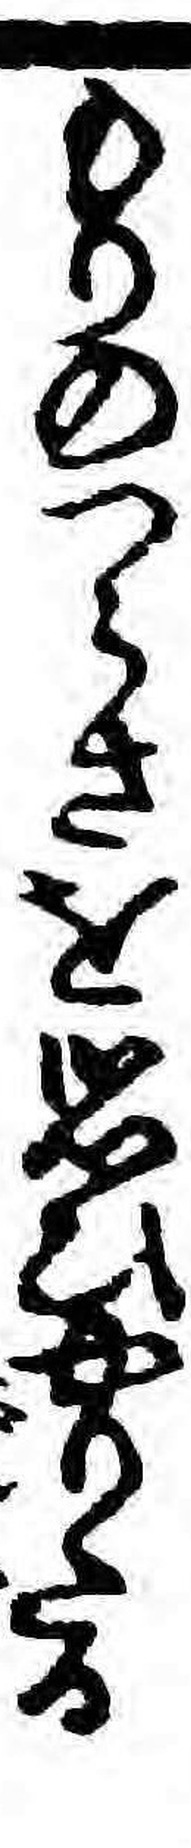もりのつらさを思ひやりたる
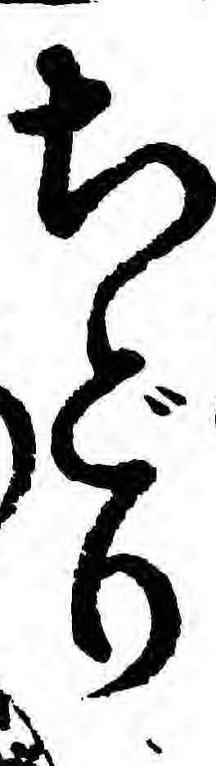ちどり
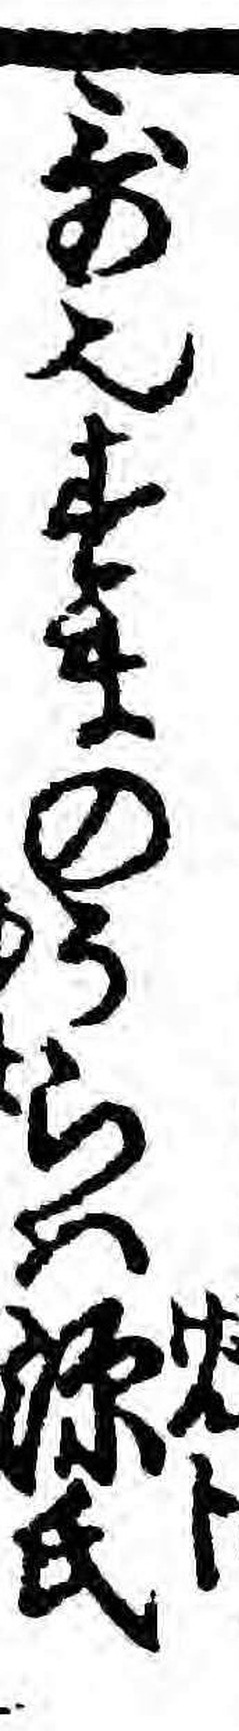哥也すまのうらは源氏
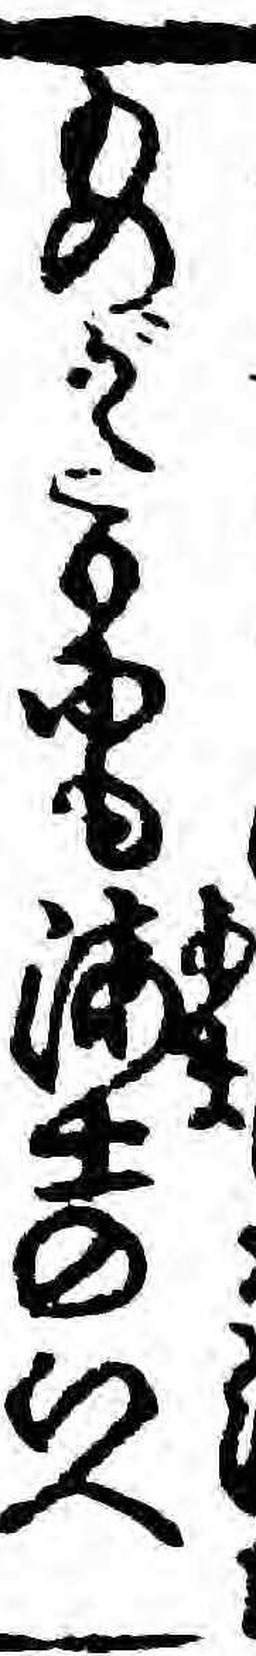ものがたりにも海士のいへ
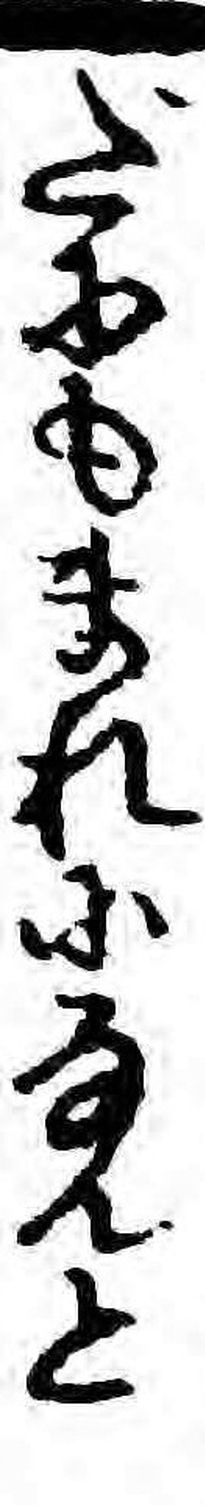だにもまれになんと
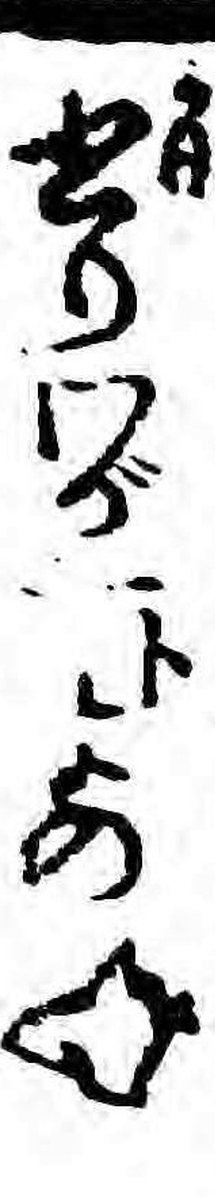書りわが一とよの
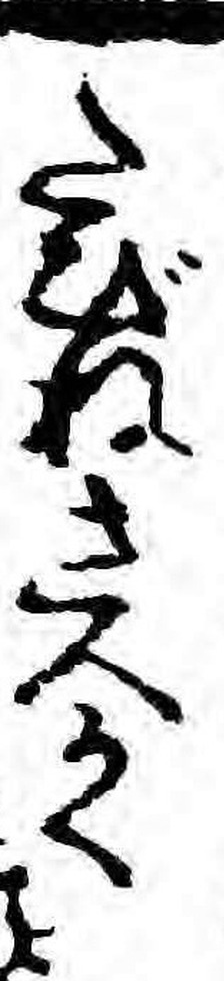たびねさへかく
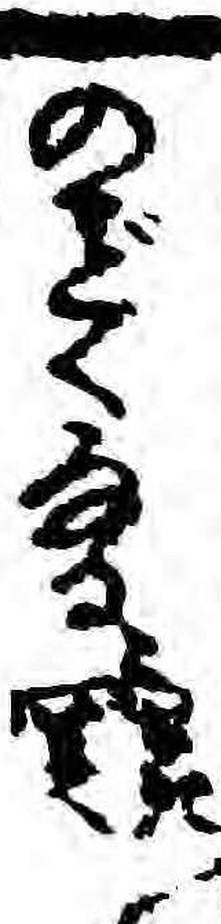のごとくなる関
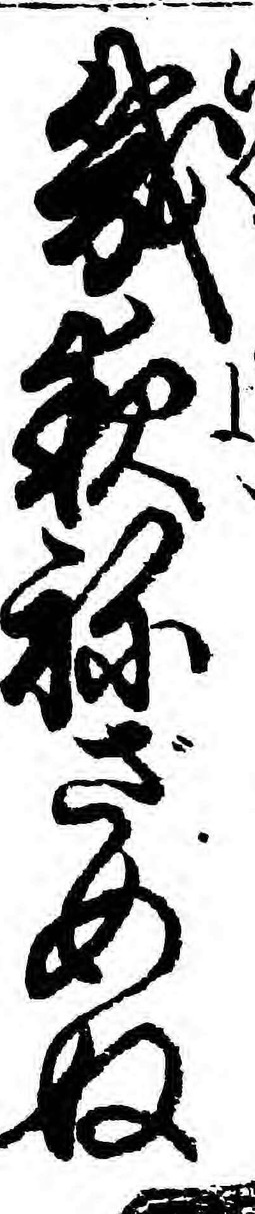幾夜ねざめぬ
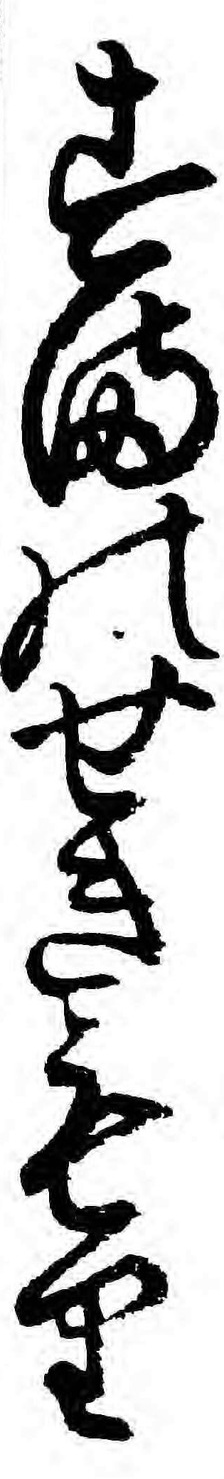すまのせきもり
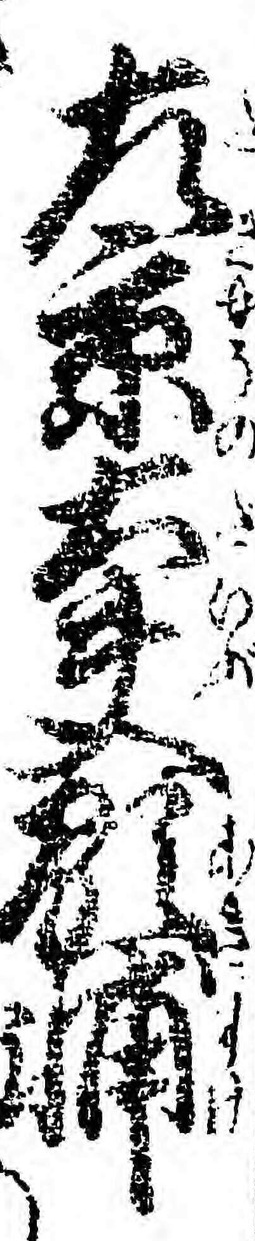左京大夫顯輔
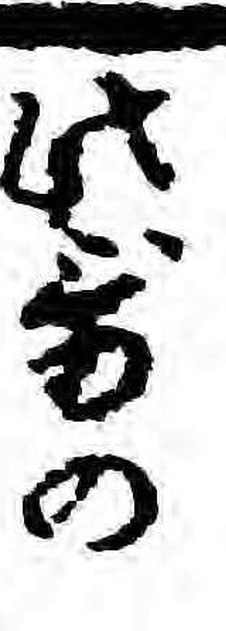此哥の
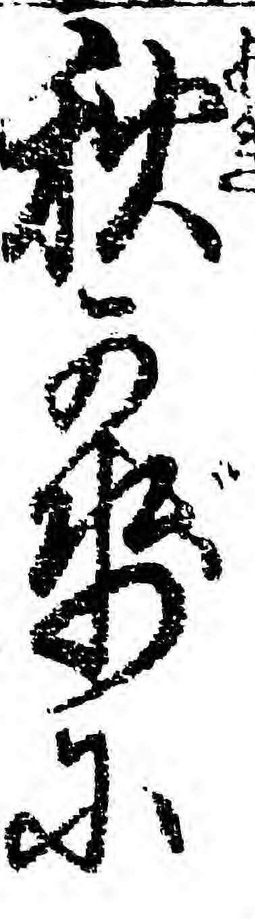秋かぜに
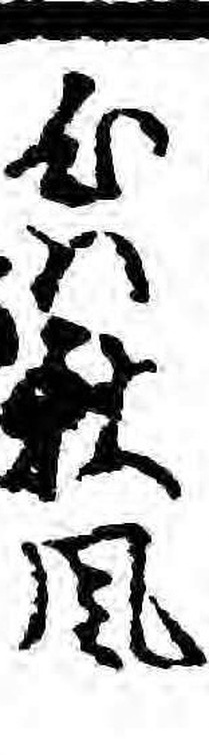心は秋風
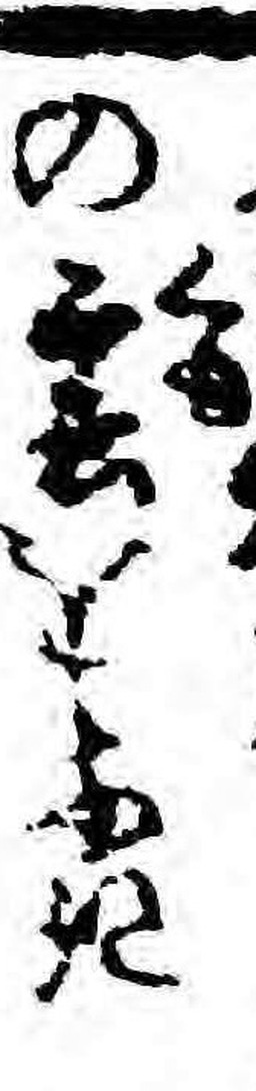の雲をふき
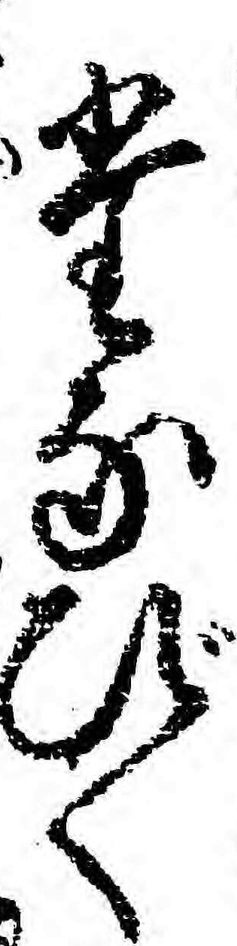たなびく
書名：頭書和歌注譯／壽賀多百人一首小倉錦
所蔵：国文学研究資料館
